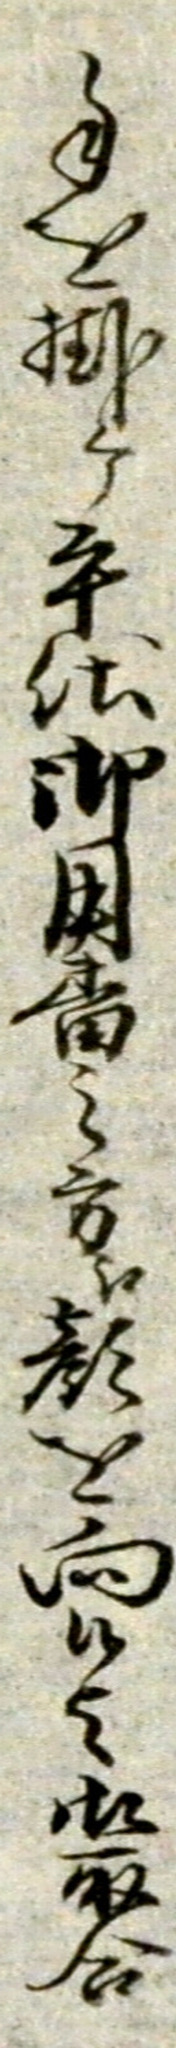手を掛ケ平伏御用番之方江顔を向候と御取合
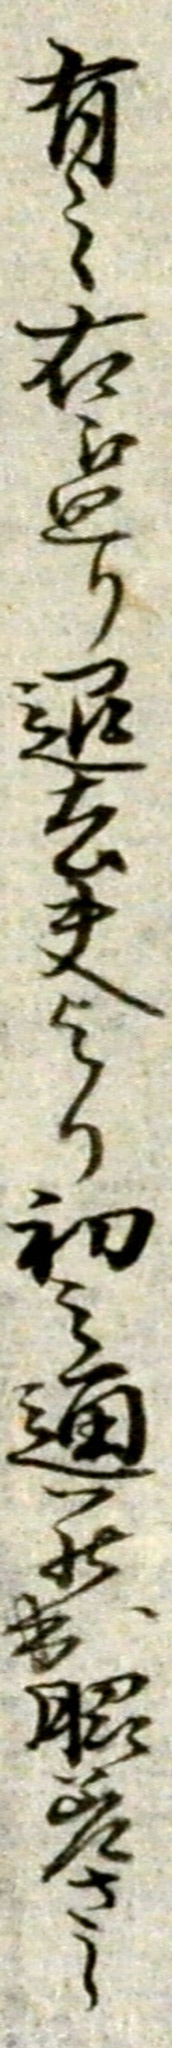有之右江廻り退去夫より初之通罷出脇差さし
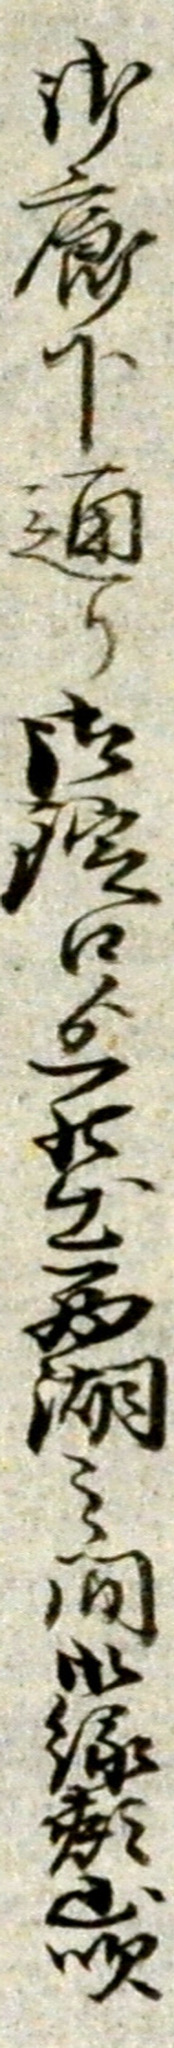御廊下通り御錠口ゟ罷出西湖之間御縁頬山吹
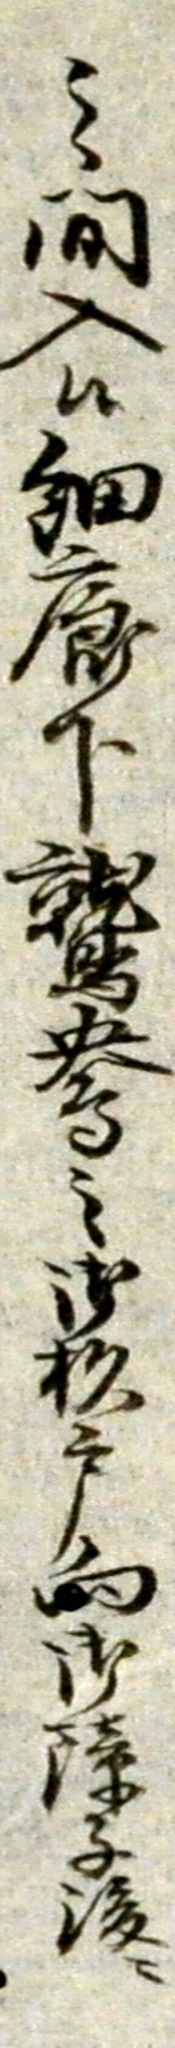之間入候細廊下鷲鶯之御杉戸向御障子後ニ
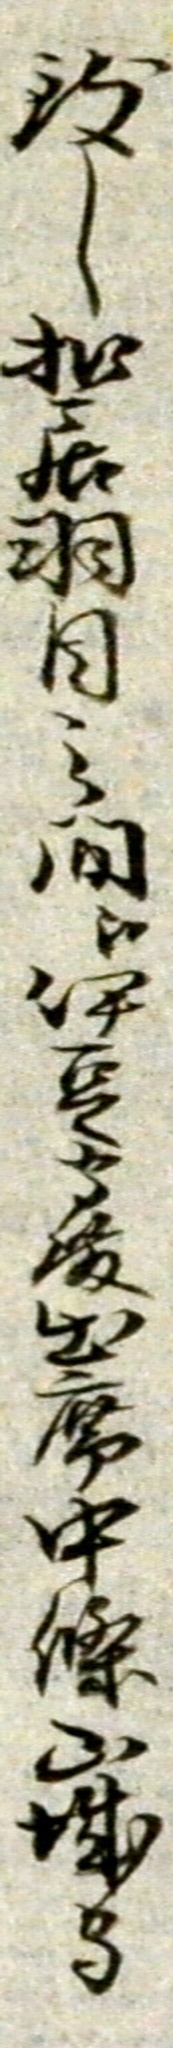致し扣居羽目之間江伊豆守殿出席中條山城守
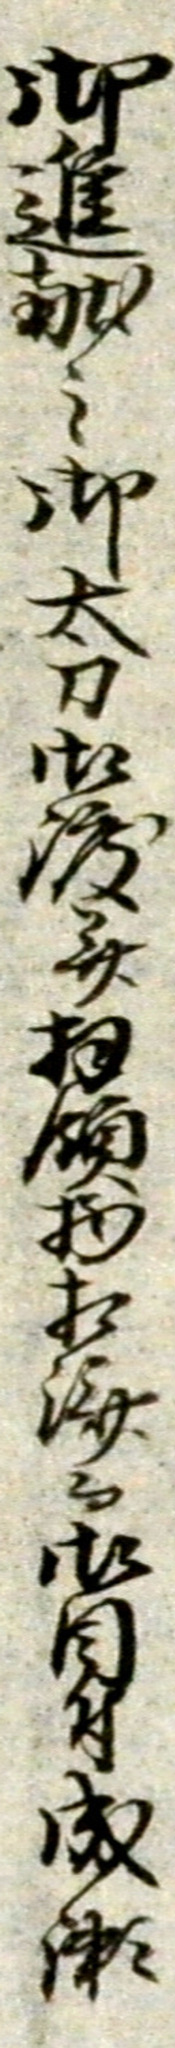御進献之御太刀御渡幷拝領物相済而御目付成瀬
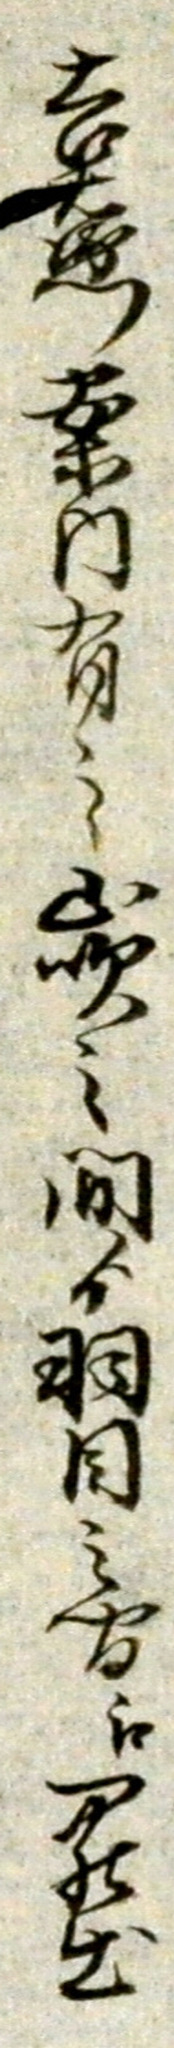吉右衛門案内有之山吹之間ゟ羽目之間江罷出
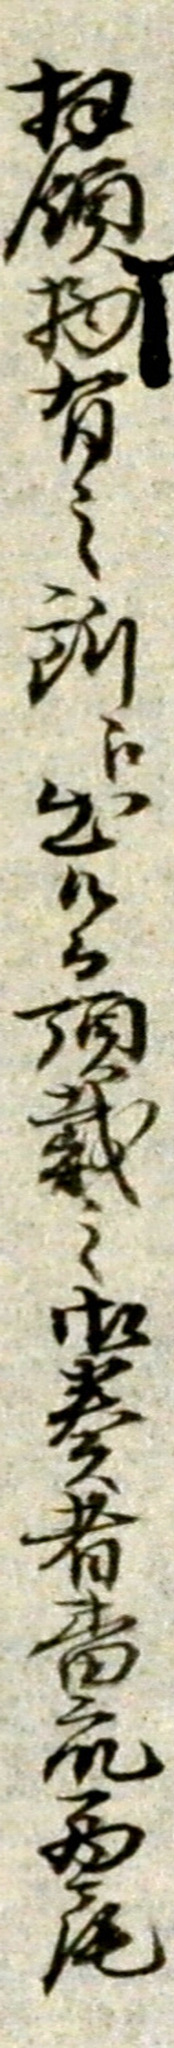拝領物有之所江出候而頂戴之御奏者番衆西尾
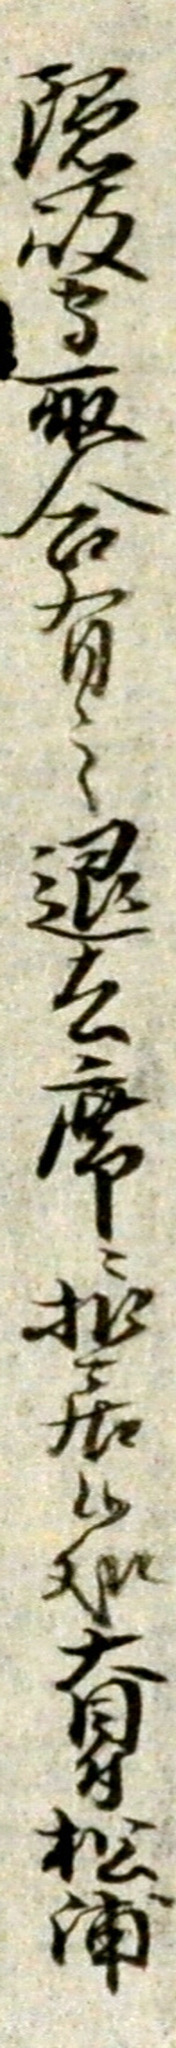隠岐守取合有之退去席ニ扣居候処大目付松浦
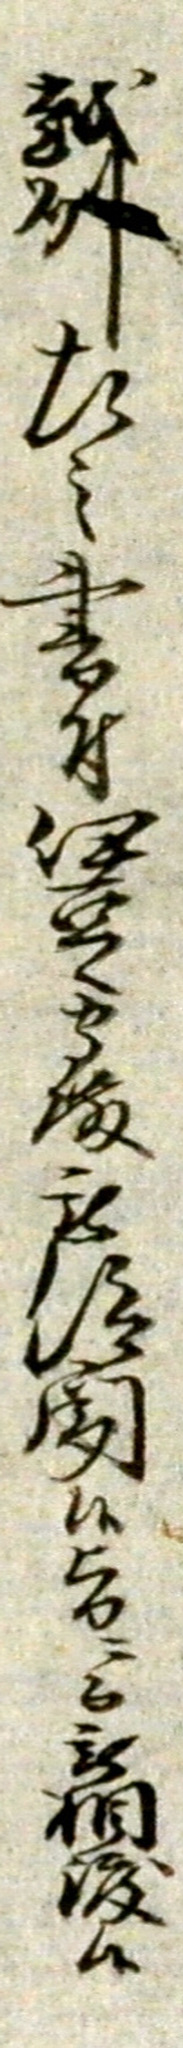越州左之書付伊豆守殿被仰聞候旨ニ而被相渡候
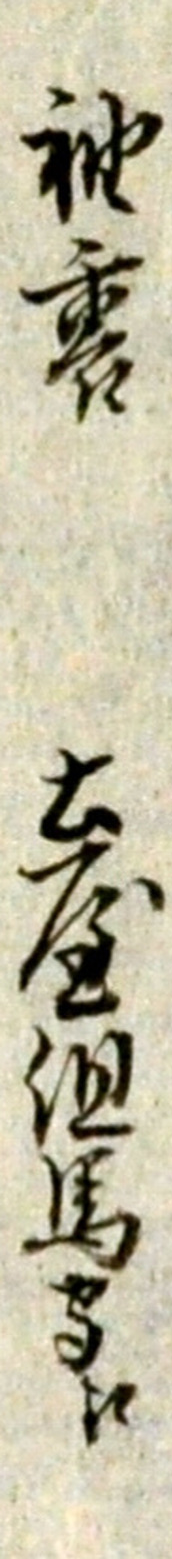袖裏土屋但馬守江
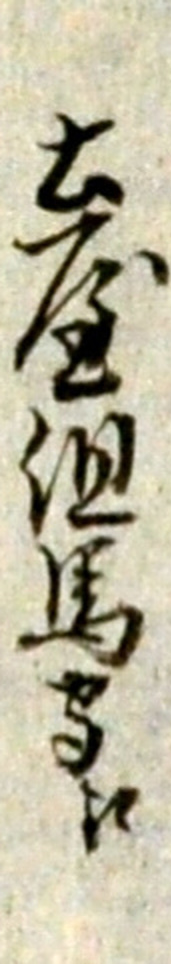土屋但馬守
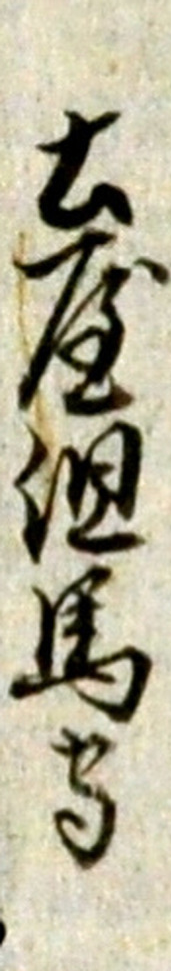土屋但馬守
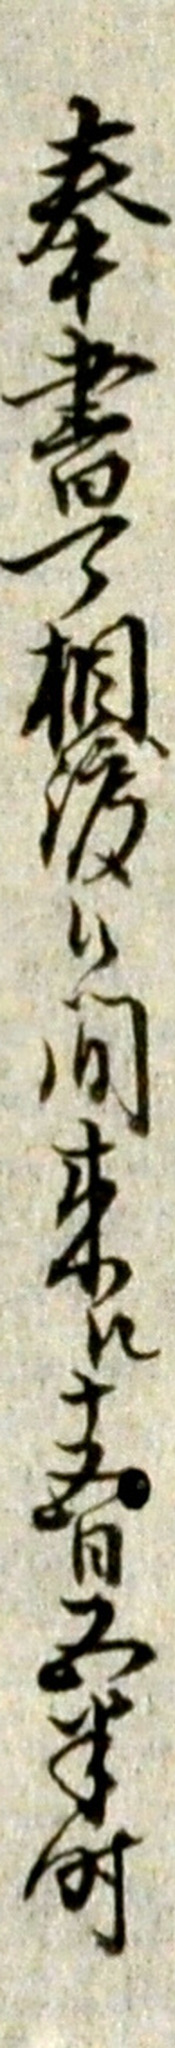奉書可相渡候間来ル十五日五半時
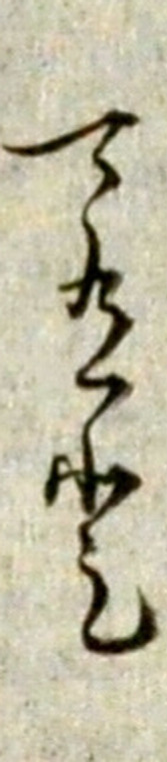可有登
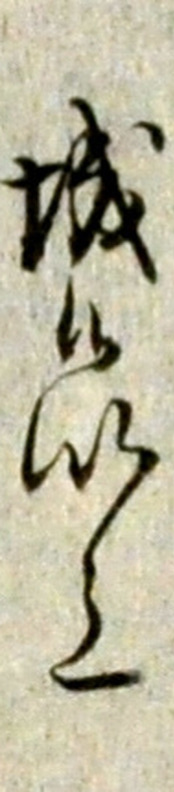城候以上
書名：日光御名代相勤候節ノ留
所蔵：伊那市立高遠町図書館・合同会社AMANE
